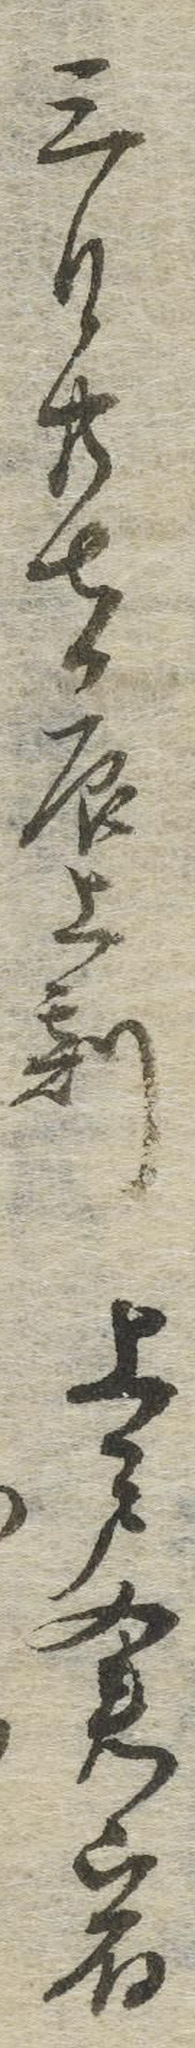三月廿七日辰上刻上戸倉宿
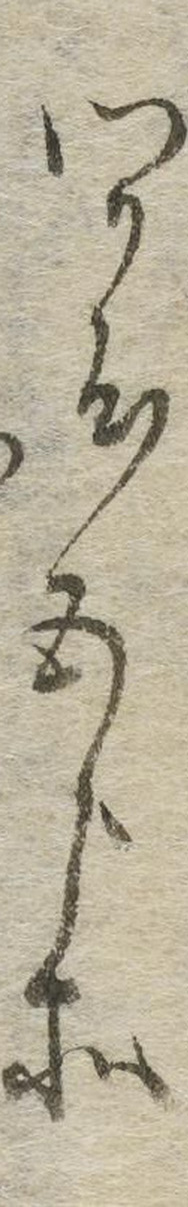問屋五郎兵衛
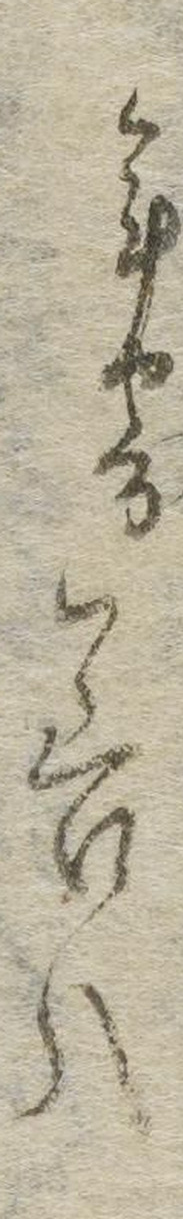年寄善八
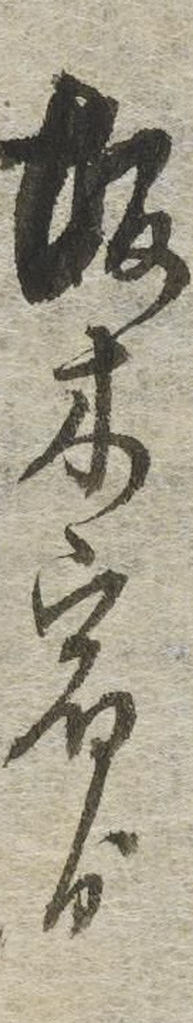坂木宿ゟ
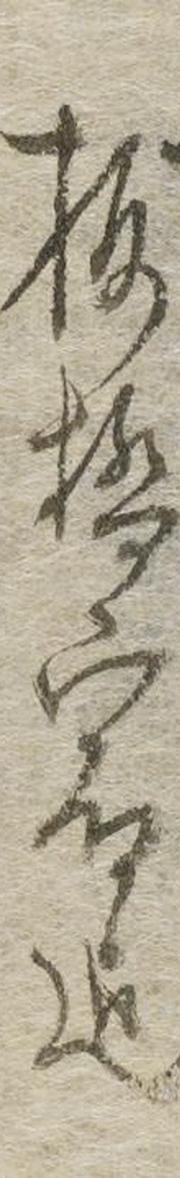板橋宿迄
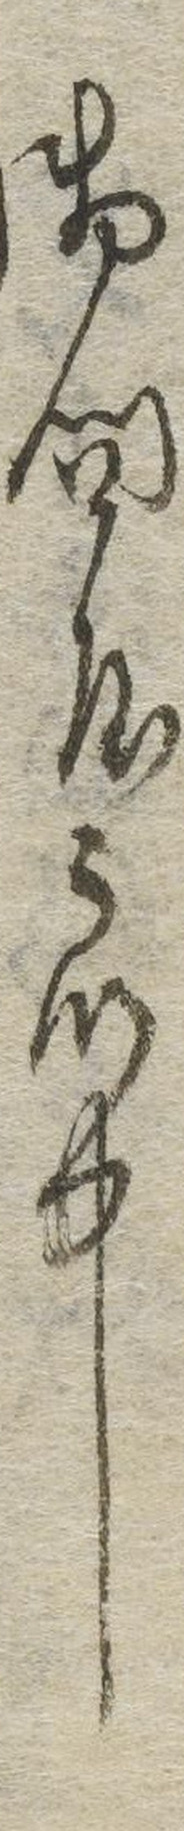御問屋衆中
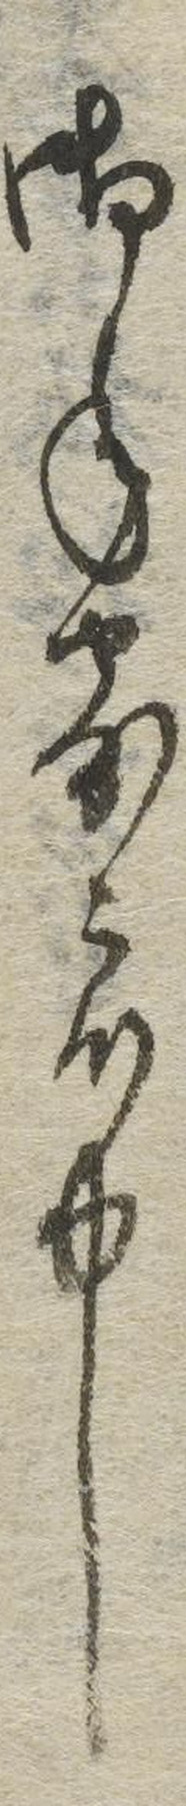御年寄衆中
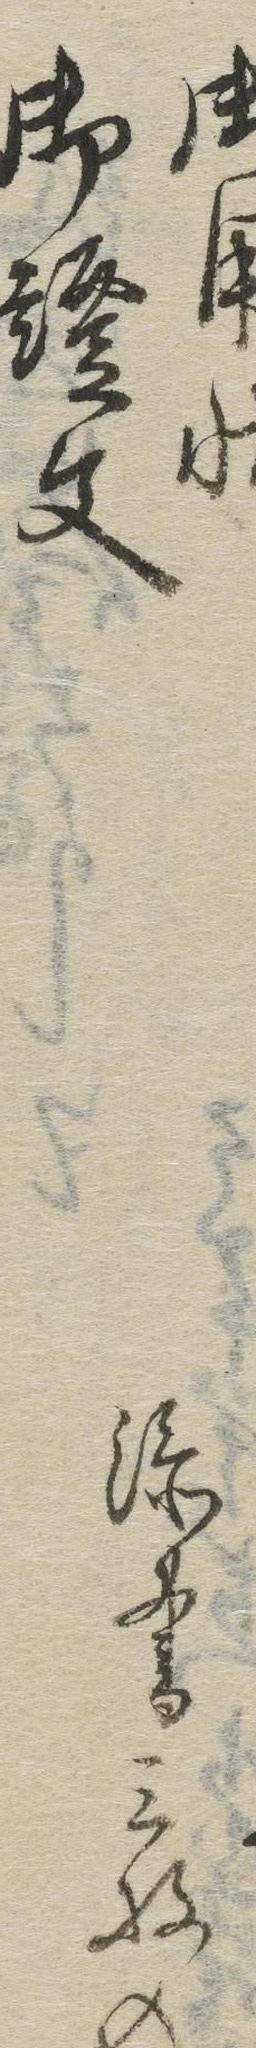御證文添書三枚入
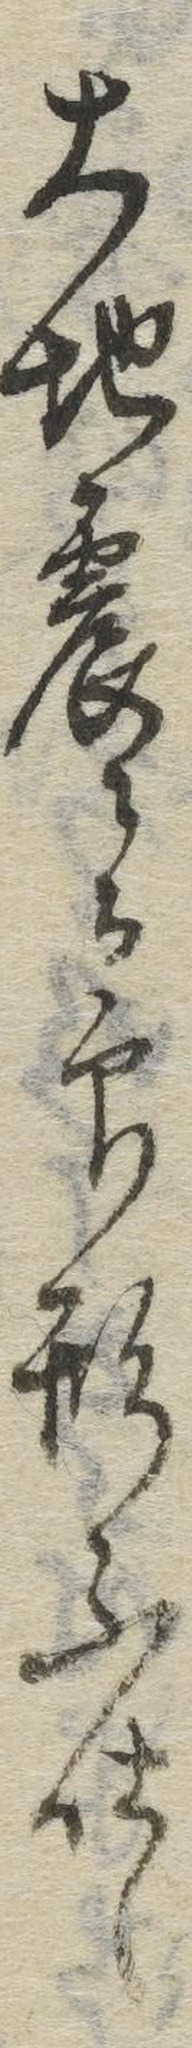大地震二而印形不仕候
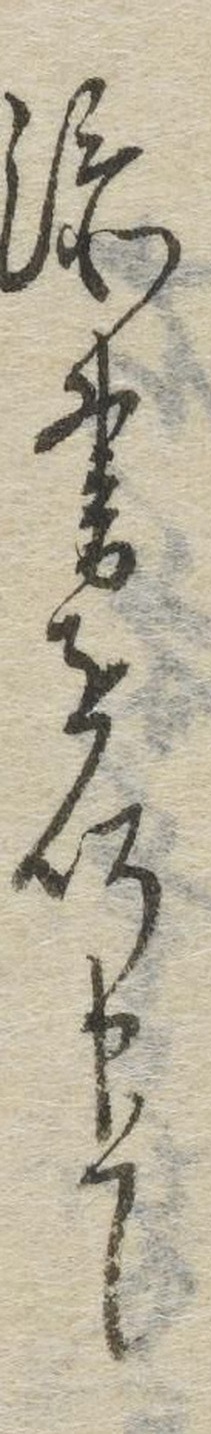添書を以申上候
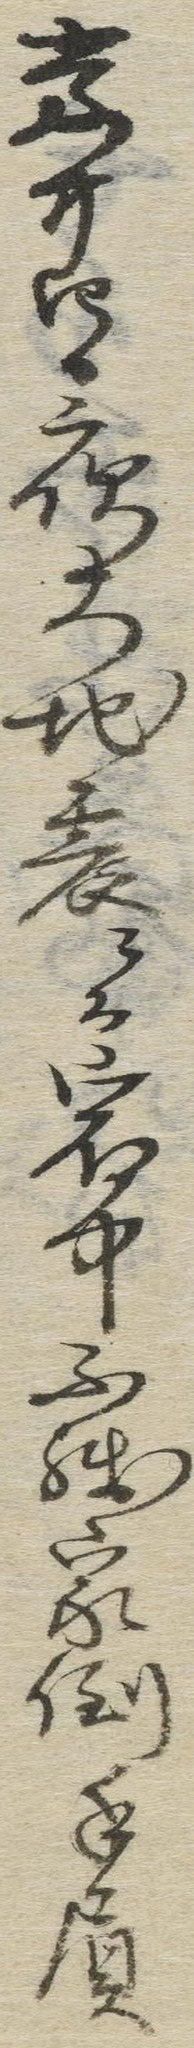当廿四日夜大地震二而宿中不残家倒手負
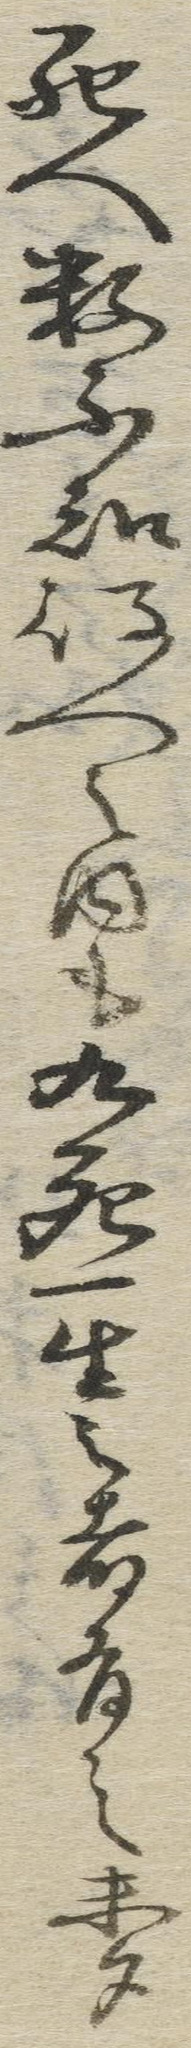死人数不知役人之内も九死一生之者有之未タ
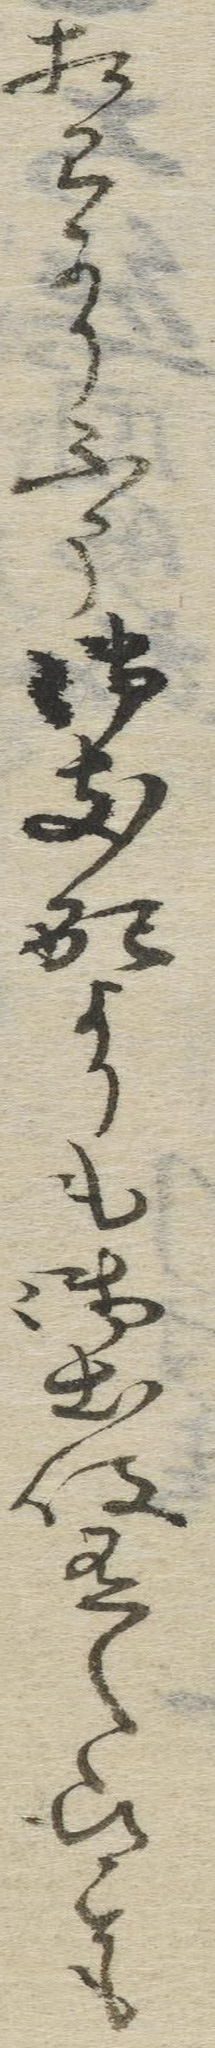相わかり不申御支配よりも御出役有之候得とも
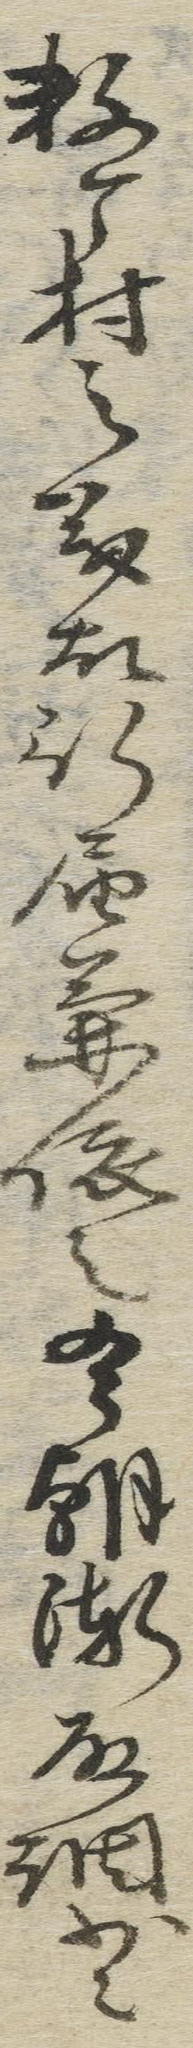数ヶ村之義故行届兼依之今朝漸取調少々
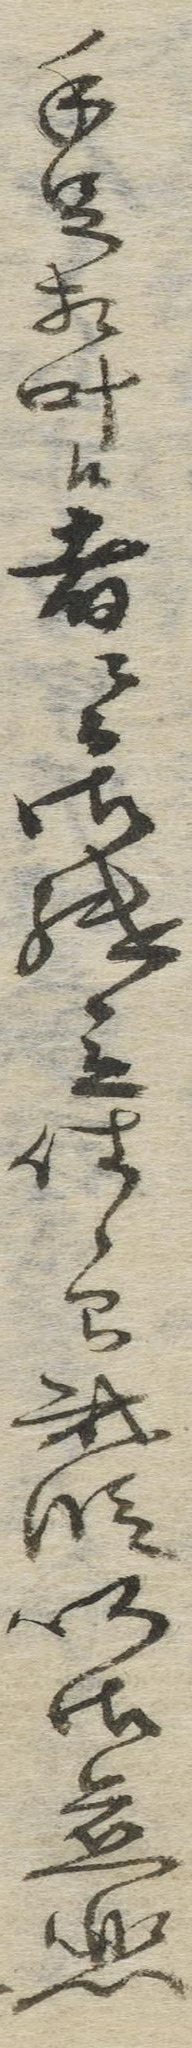手足相叶候者二而御継立仕候間此段以御慈悲
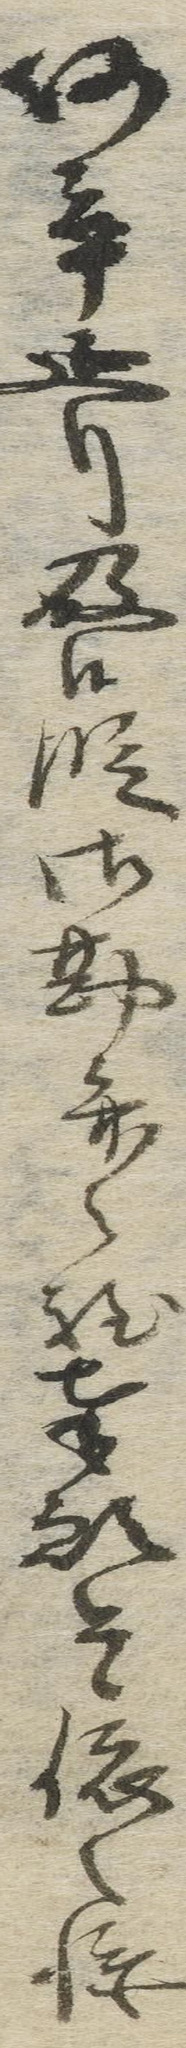何卒延引及候段御勘弁之程奉願上候依之添
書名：信濃越後　地震書留
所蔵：東京大学地震研究所図書室 Earthquake Research Institute Library, The University of Tokyo, JAPAN
